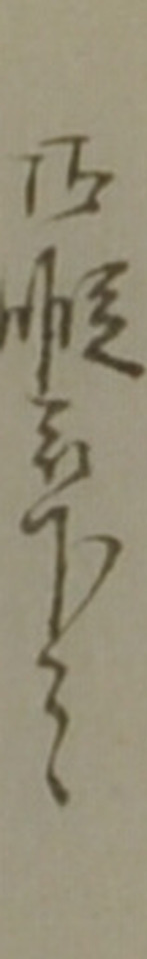御暇被下之
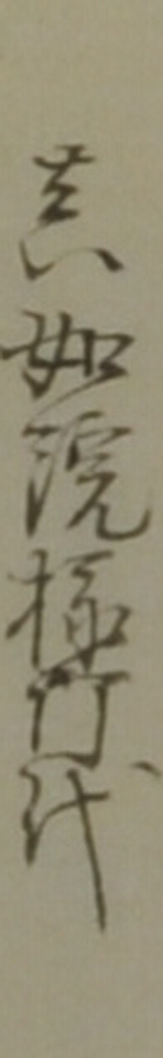真如院様御代
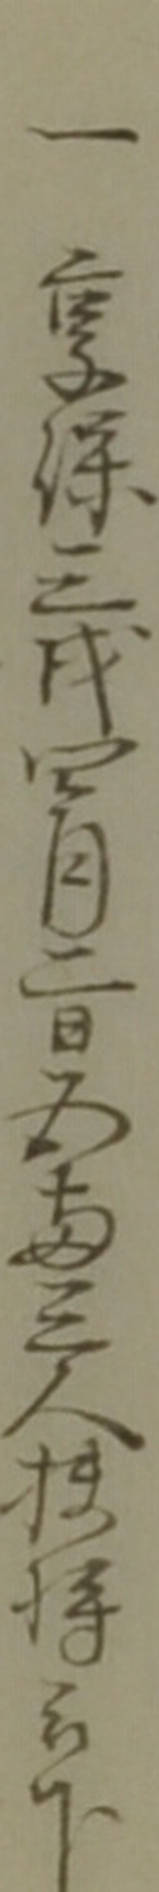一享保三戌四月二日五両三人扶持被下
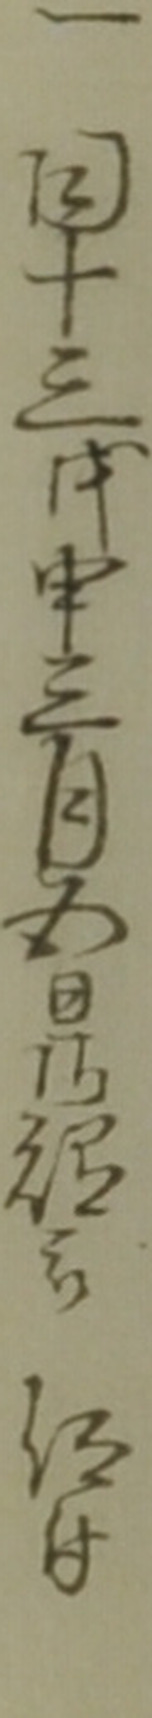一同十三戊申三月五日御賄被仰付
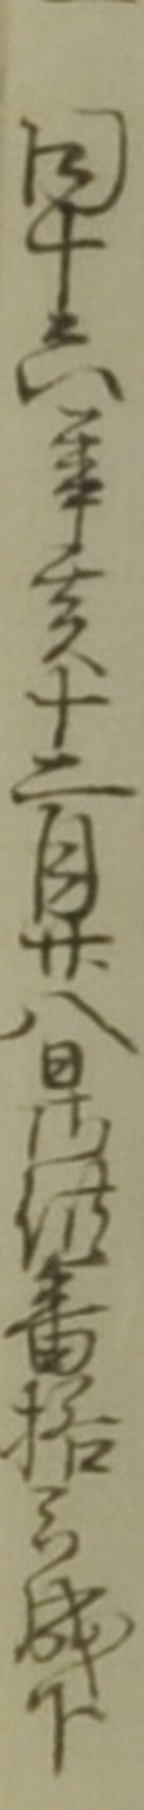一同十六辛亥十二月廿八日御供番格被成下

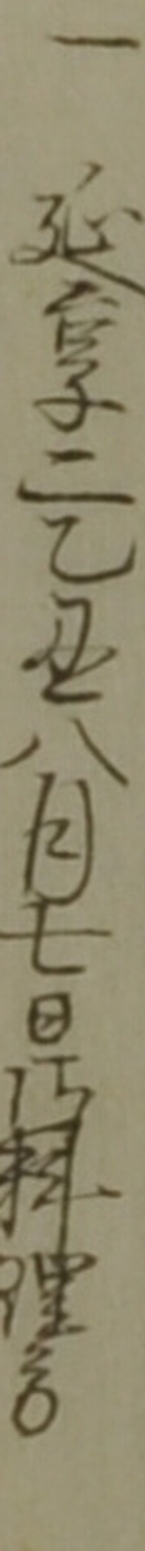一延享二乙八月七日御料理方
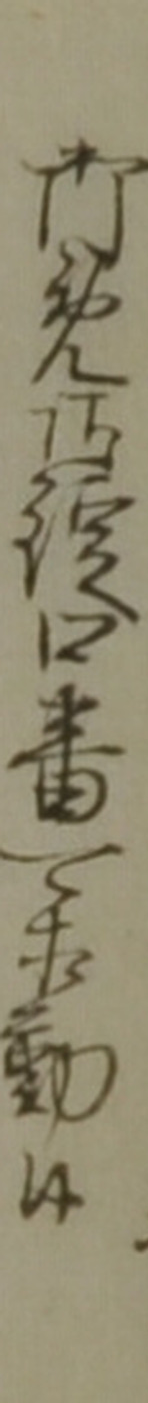御免御錠口番可相勤候
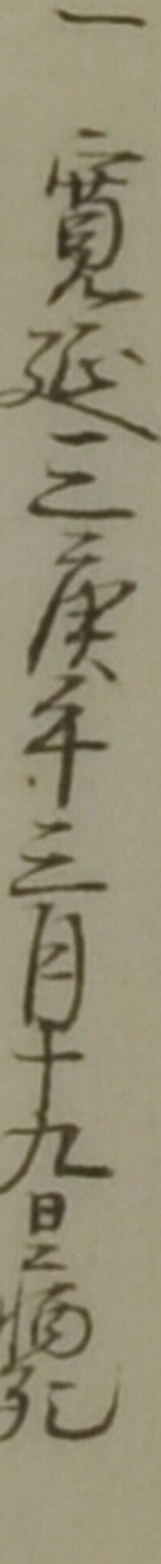一寛延三庚午三月十九日病死
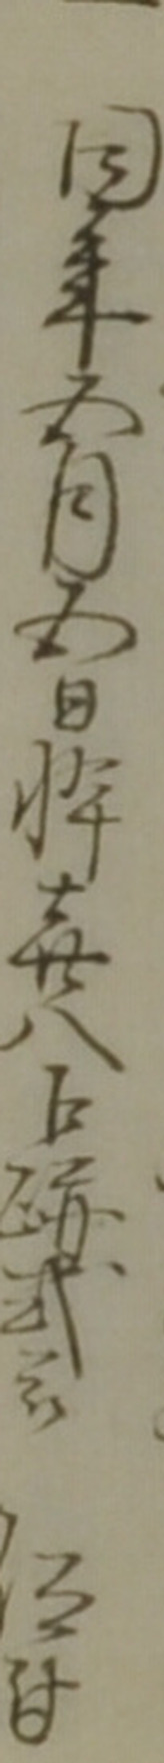一同年五月五日忰喜八江跡式被仰付
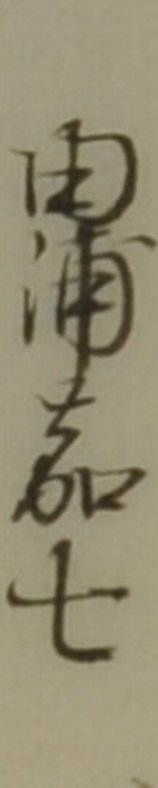由浦嘉七
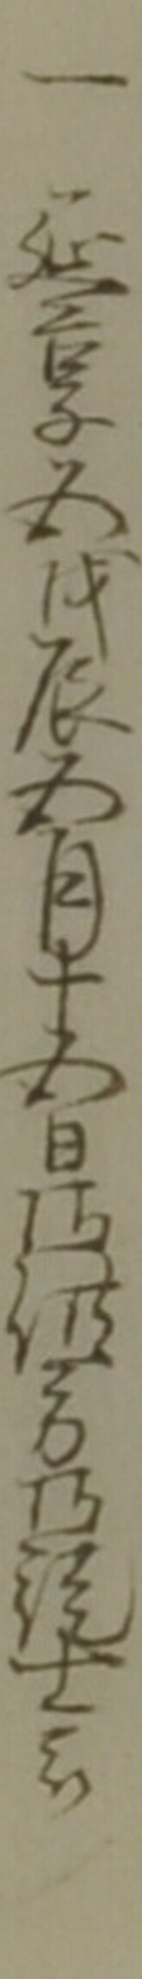一延享五戌辰五月十五日御供御徒士被
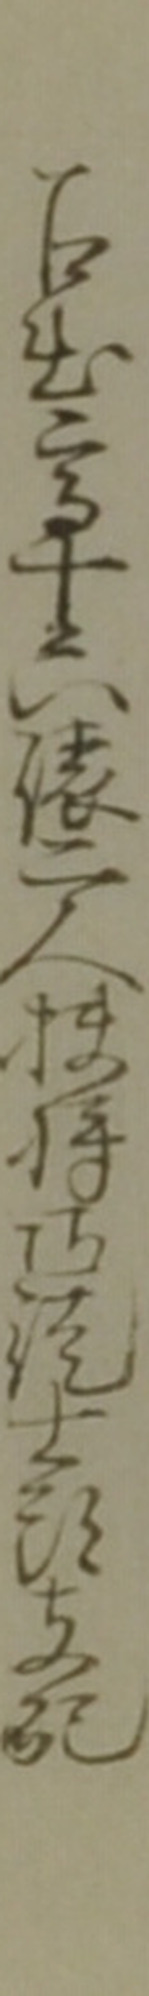召出高六俵二人扶持御徒士頭支配
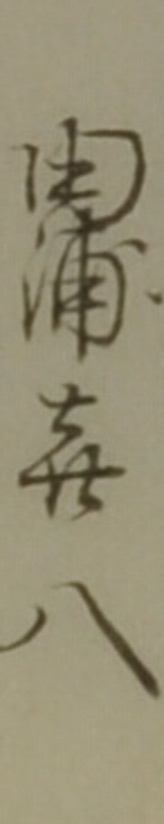由浦喜八
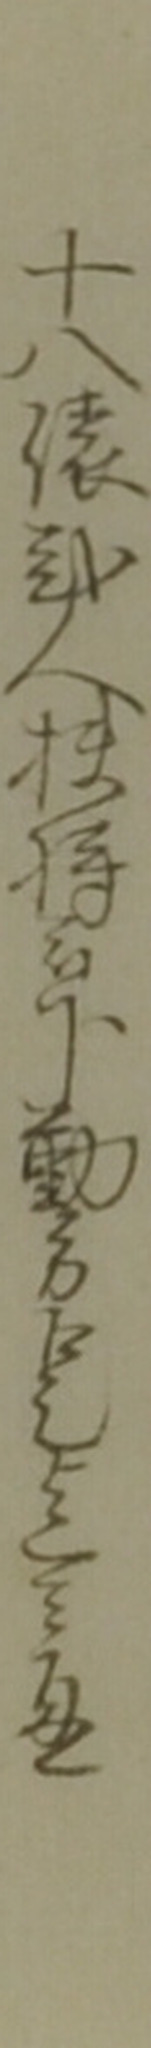十八俵弐人扶持被下勤方是迄之通
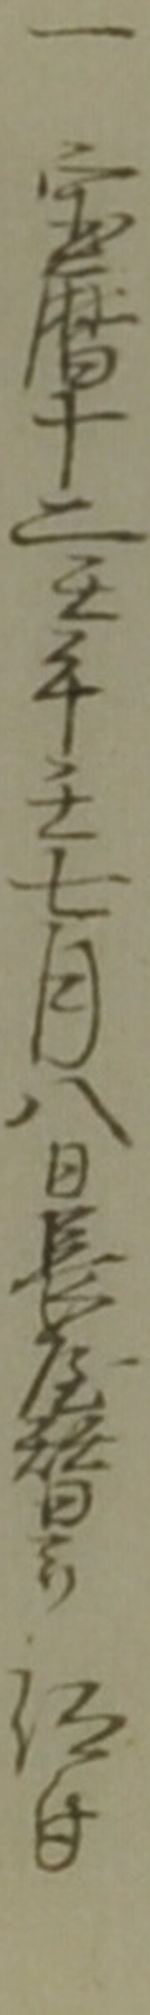一宝暦十二壬午閏七月八日長屋替被仰付
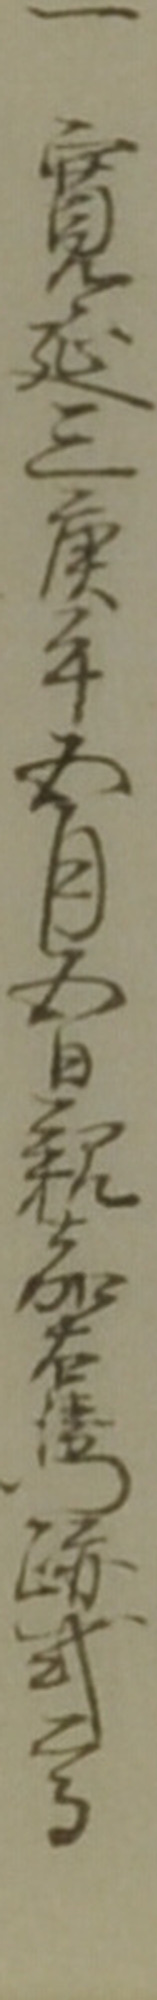一寛延三庚午五月五日親嘉右衛門跡式高
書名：無足廃家（壱）
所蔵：伊那市立高遠町図書館・合同会社AMANE
